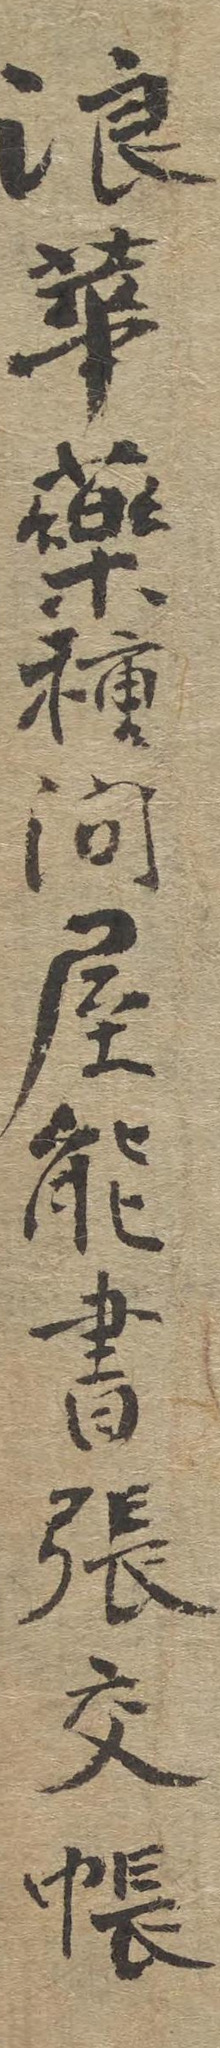浪華薬種問屋能書張交帳二

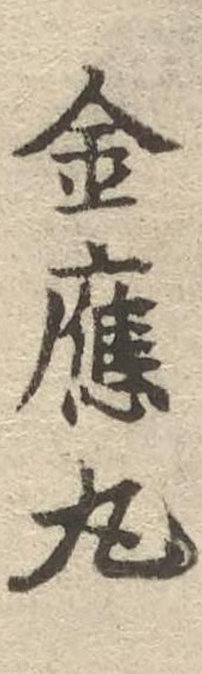金応丸
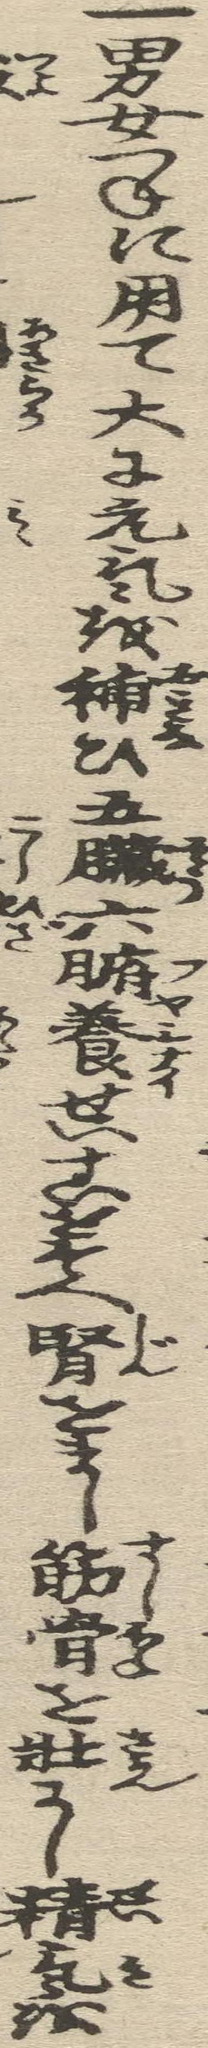一男女つねに用て大に元気を補ひ五臓六府養せいすいをそへ腎をまし筋骨を壮にし精気を
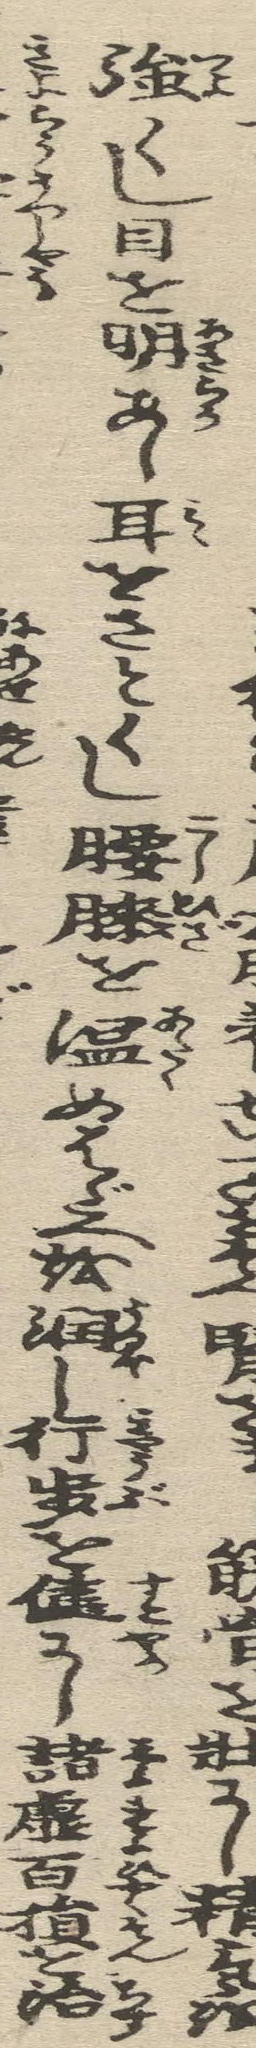強くし目を明あし耳をさとくし腰膝を温めはだへを潤し行歩を健にし諸虚百損を治
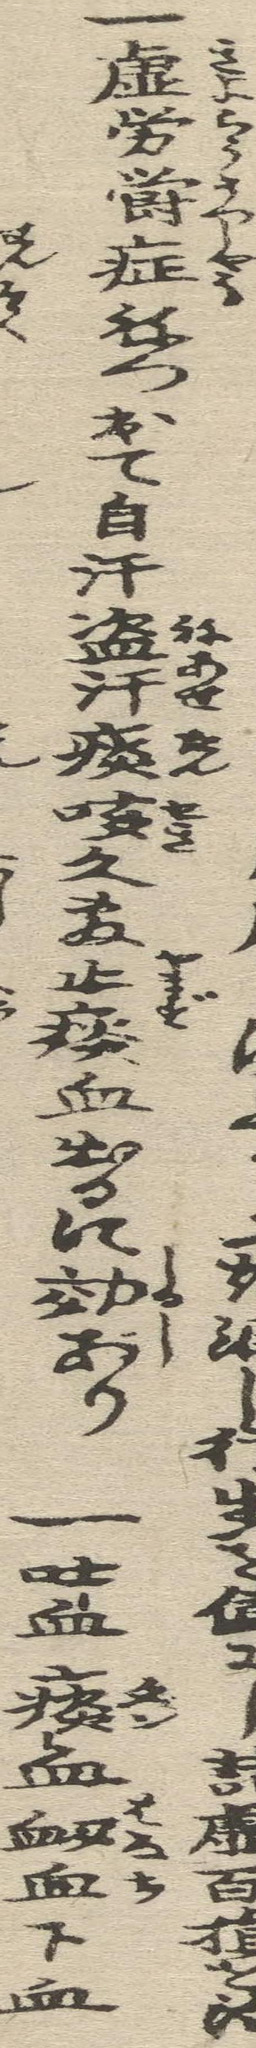一虚労鬱症ねつ出て自汗盗汗痰咳久敷止痰血出るに効あり一吐-血痰-血衂血下血
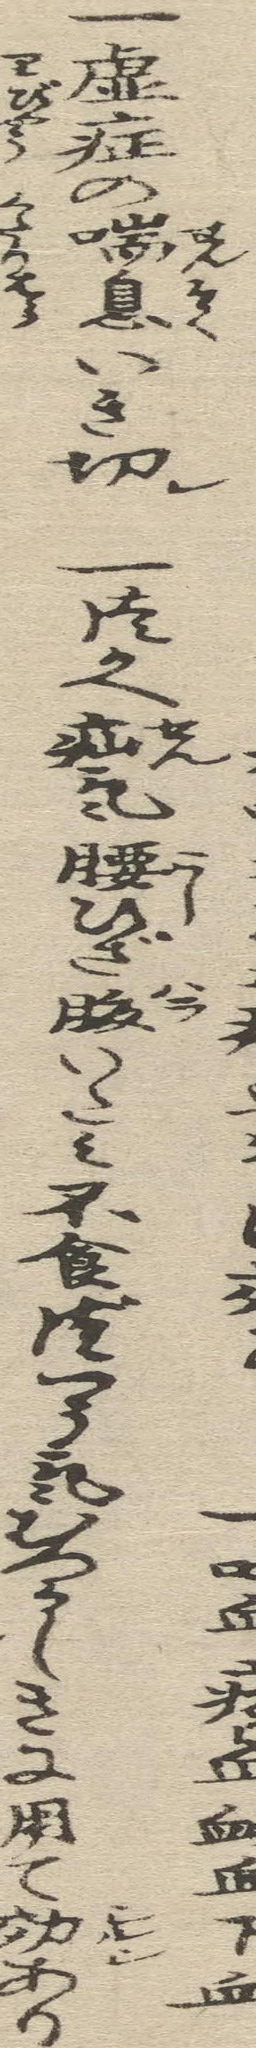一虚症の喘息いき切ㇾ一つかへ疝気腰ひざ腹いたみ不食づつう気むつかしきに用て効あり
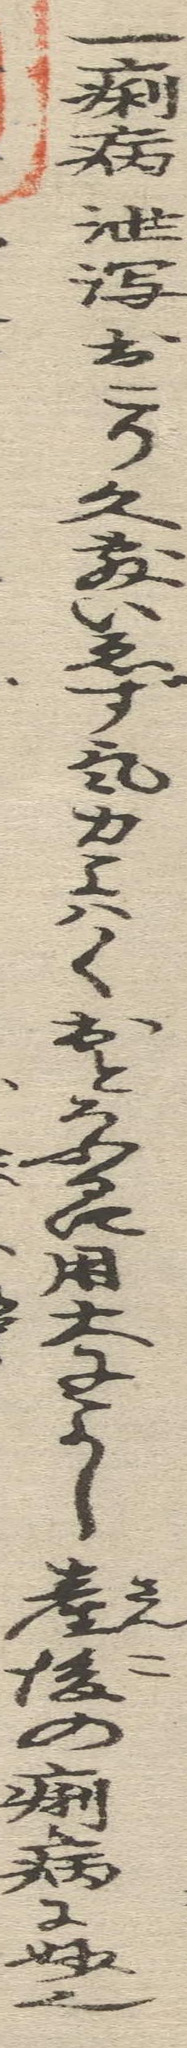一痢病泄瀉おこり久敷いゑず気力よはくおとろふるに用大によし産後の痢病に妙也
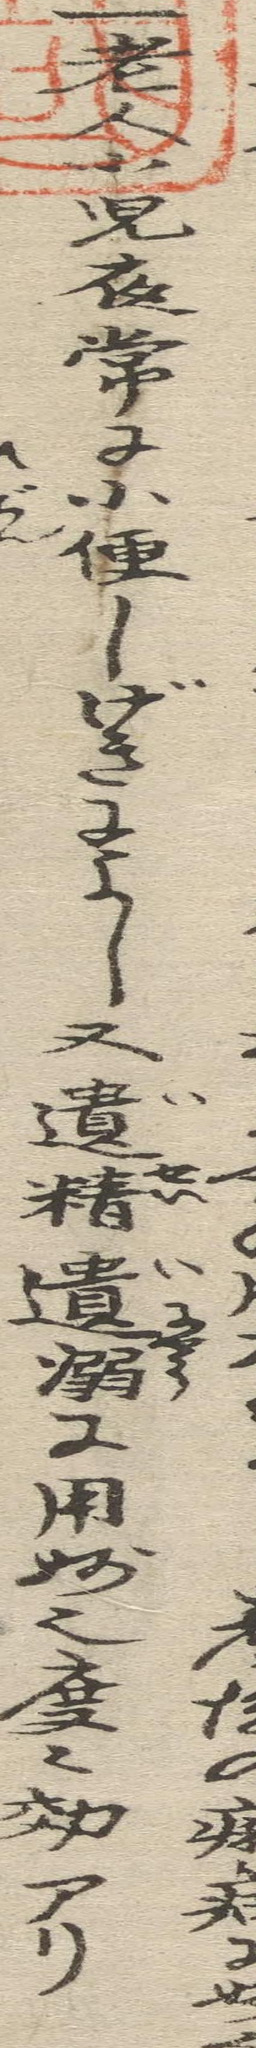一老人小児夜常に小便しげきによし又遺精遺溺に用妙也度々効アリ
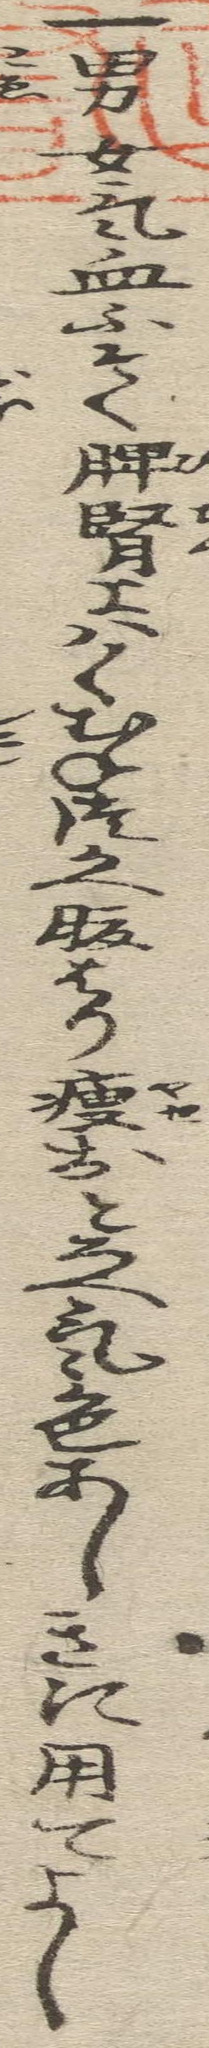一男女気血ふそく脾腎よはくむねつかへ腹はり痩おとろへ気色あしきに用てよし
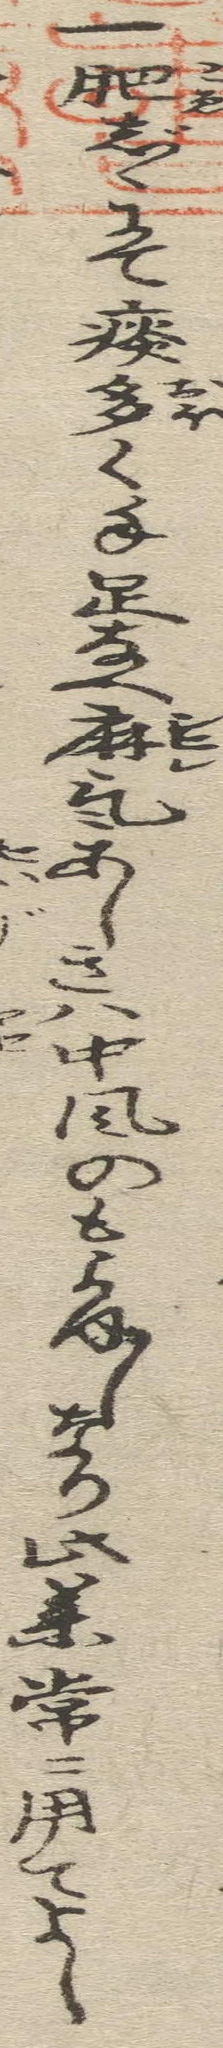一肥じゝにて痰多く手足なへ麻気あしきは中風のもよほしなり此薬常に用てよし
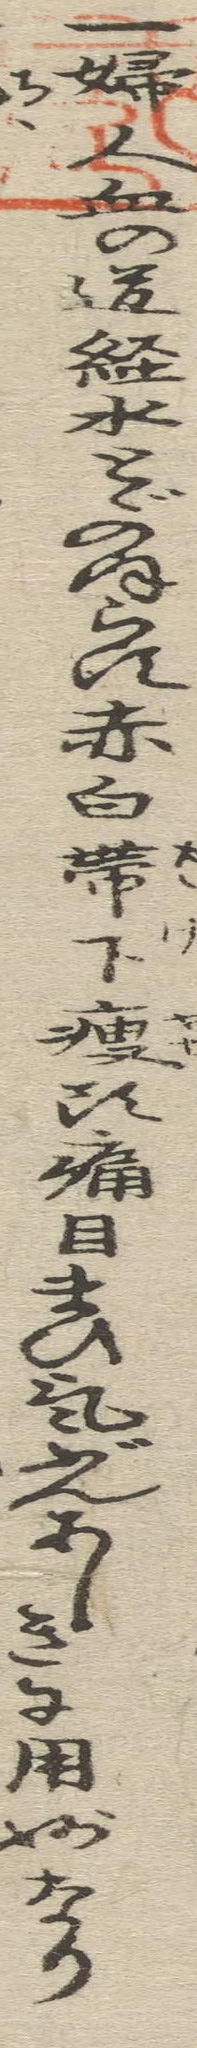一婦人血の道経水とゞのほらす赤白帯下痩頭痛目まひ気ぶんあしきに用妙なり
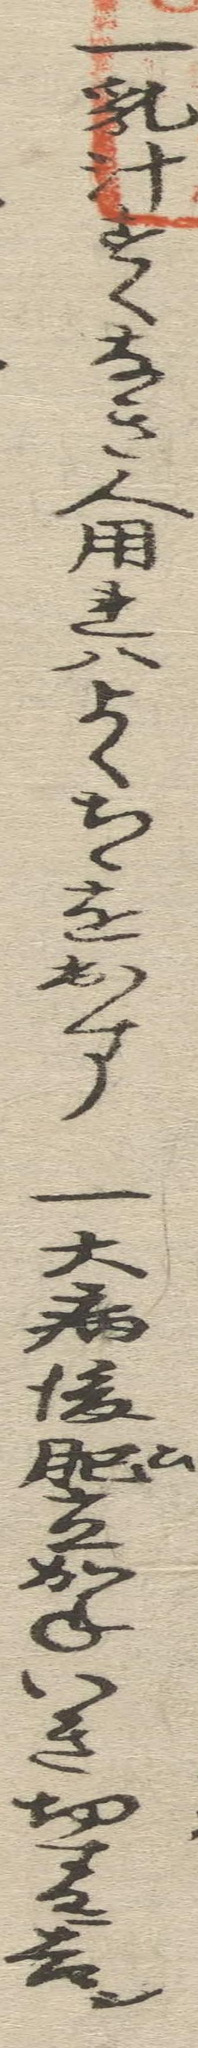一乳汁すくなき人用れはよくちゝを出す一大病後肥立かねいき切するに吉也
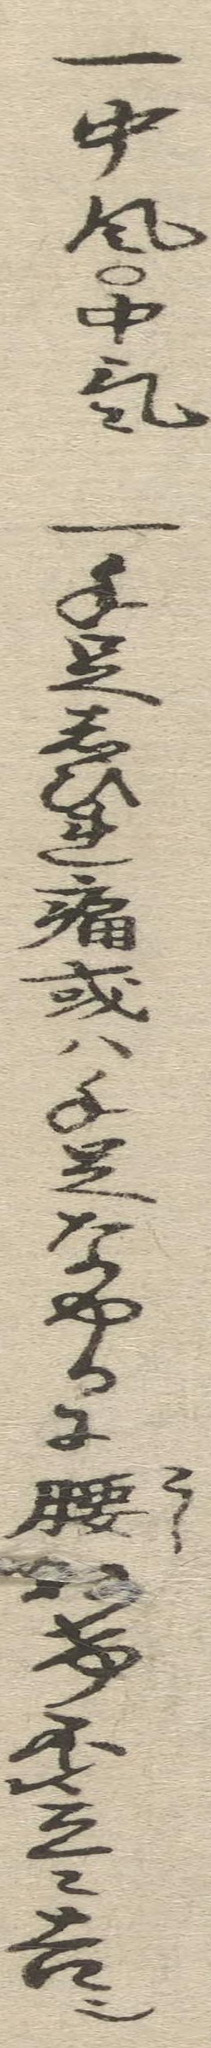一中風◦中気一手足しひれ痛或は手足なゆるに腰ぬけ不立に吉也
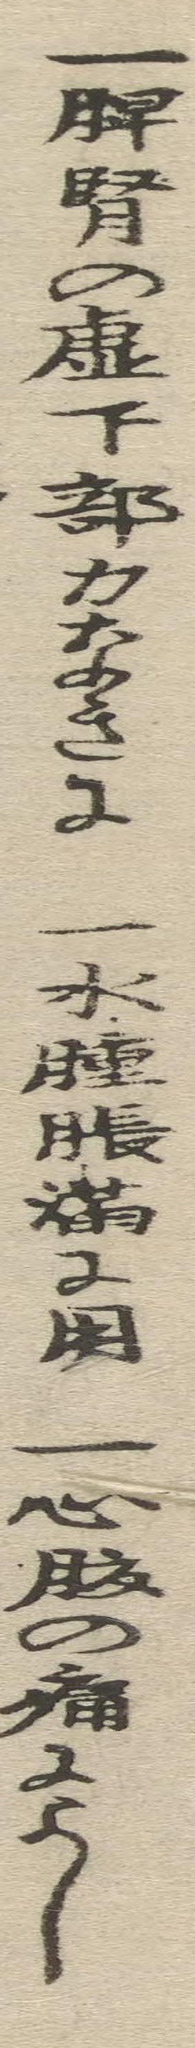一脾腎の虚下部力なきに一水腫脹満に用一心腹の痛みによし
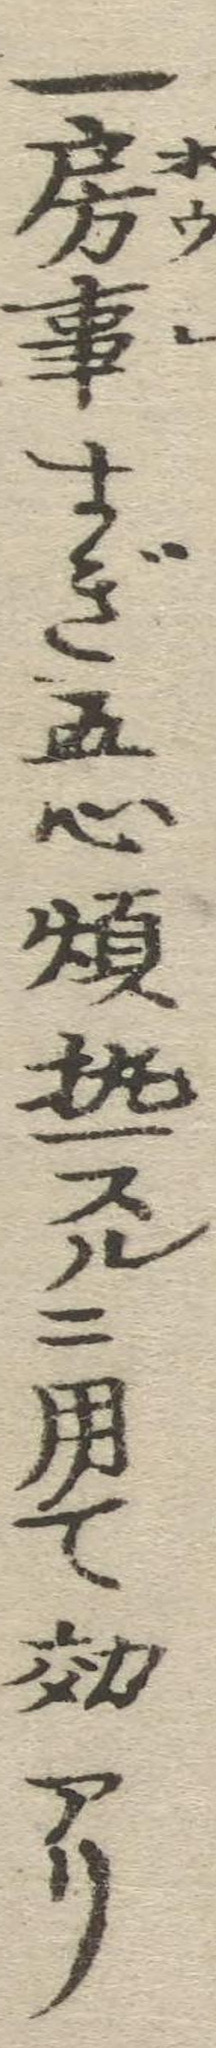一房事すぎ五心煩熱スルニ用て効アリ
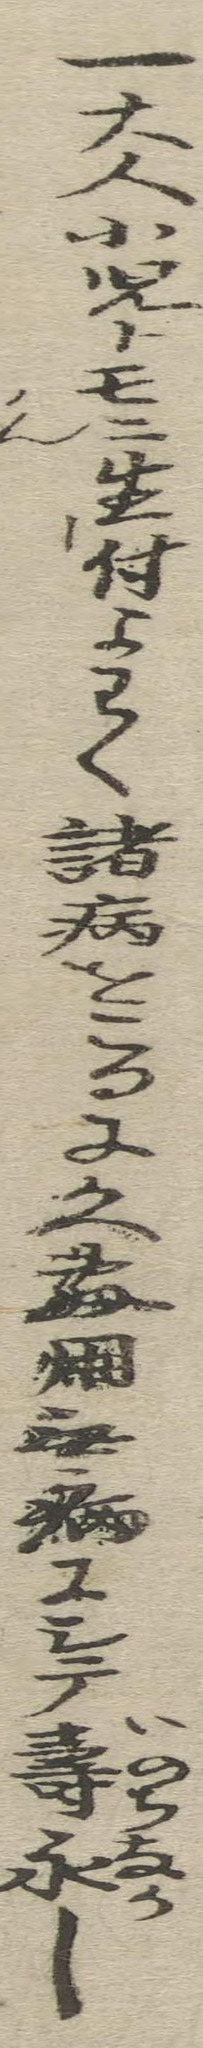一大人小児トモニ生-付よわく諸病をこるに久敷用無病にシテ寿永し
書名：浪華薬種問屋能書張交帖. 二
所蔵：国立国会図書館 National Diet Library, JAPAN
